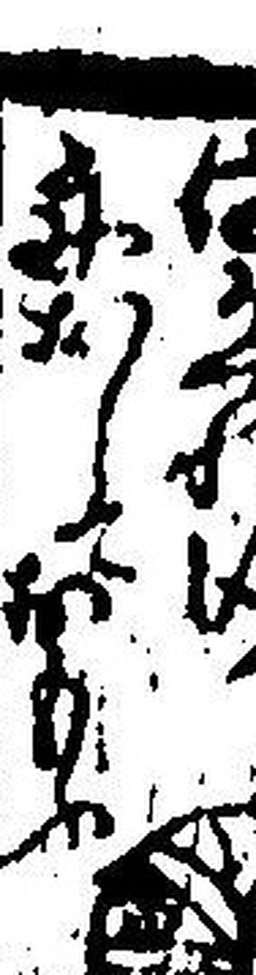舟おしそおもふ
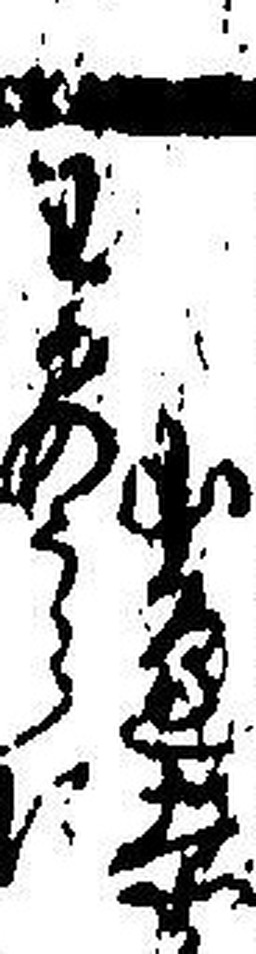わかのうらに
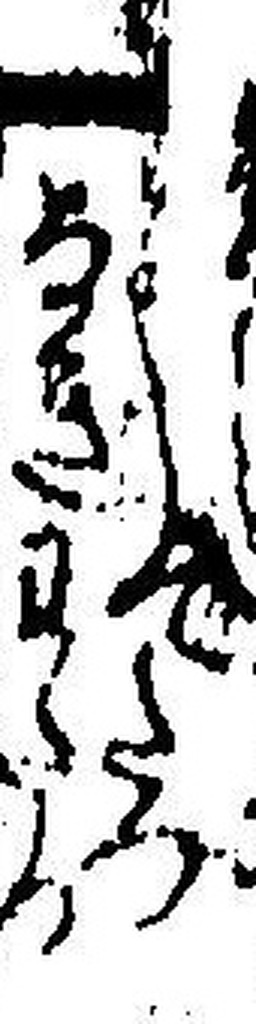なきわたる
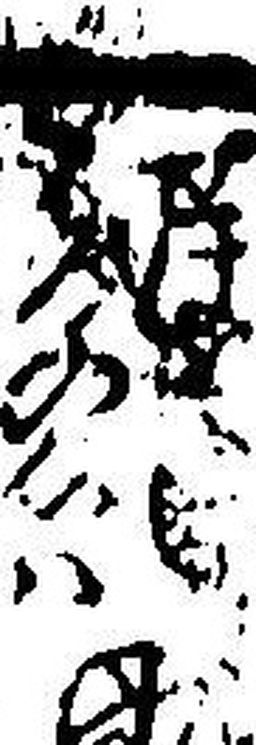はるの心は
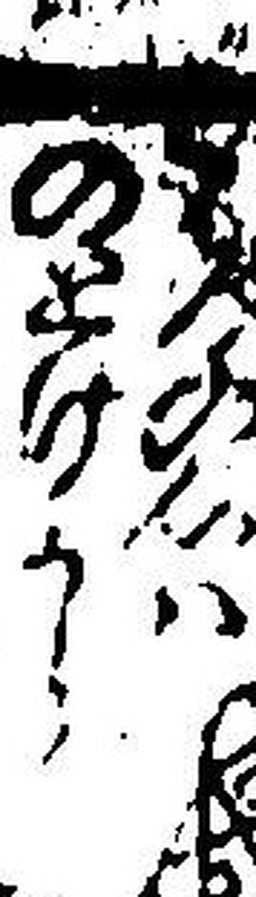のとけから
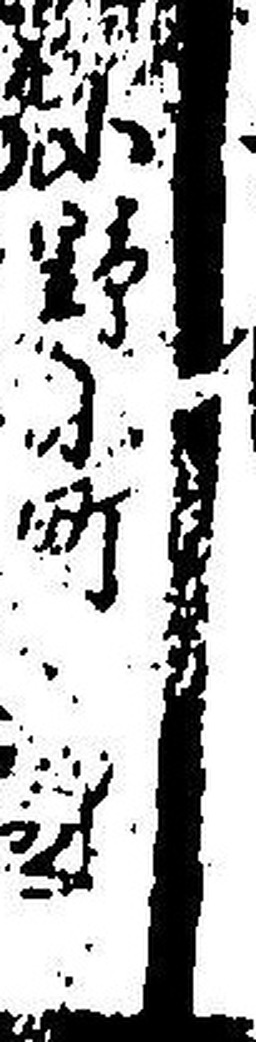小野小町

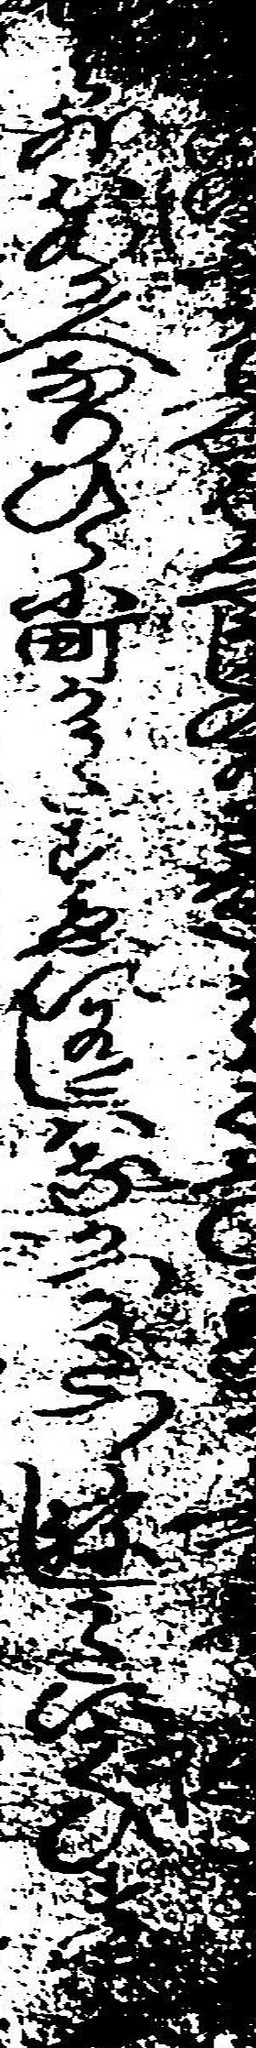はある人なりひら小町かうたすゑに有しはなかつかさつらねしうたにうくひす
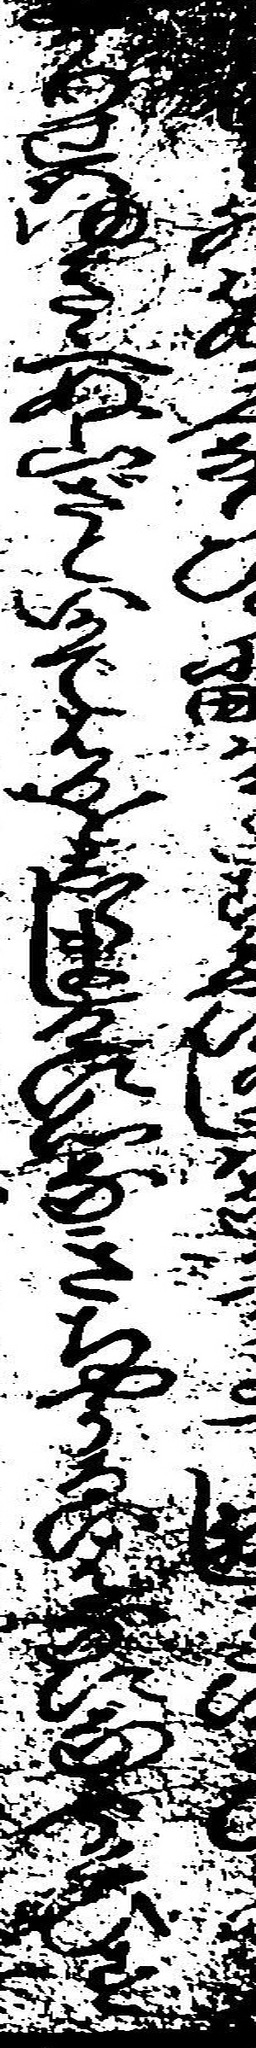かりせはゆきゝへぬ山ざといかではるをしらましけに心なきちやうるいはなになひす
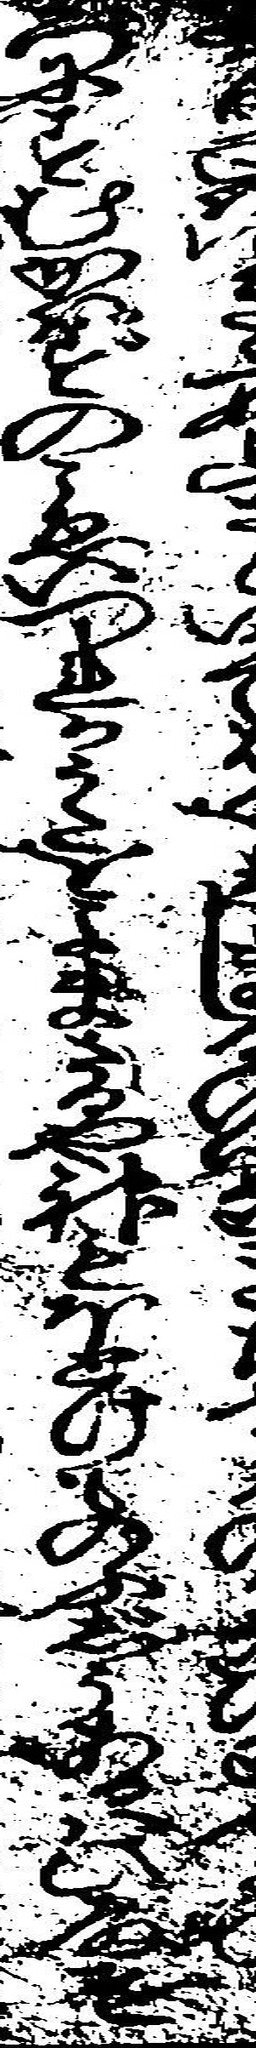つにすむかはずのこゑいつれかうたをよまさるや神もほとけものふじうあるは此そ
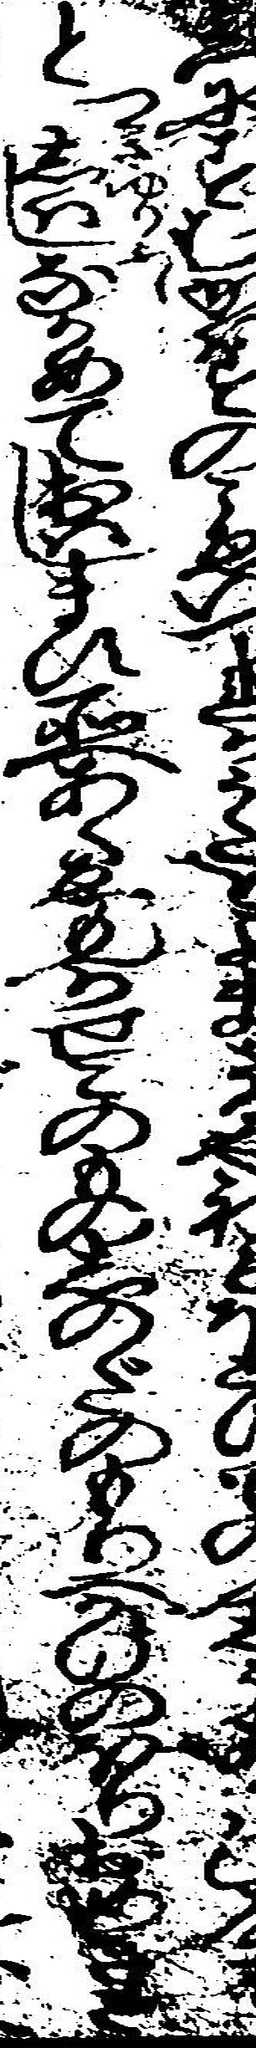とつきゆりふししはしなかめておはします所へあくゑもんかせこのものしのだのもりへかいのほりおめ
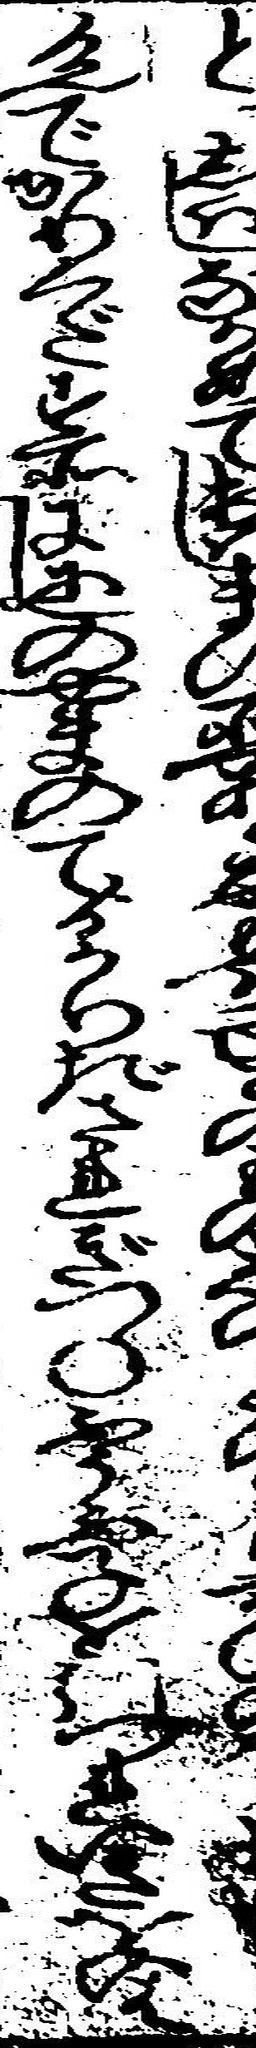けんでかりくだす所ににしのやまのてゟかりだされぎつねふうふ子を引つれいきをいは
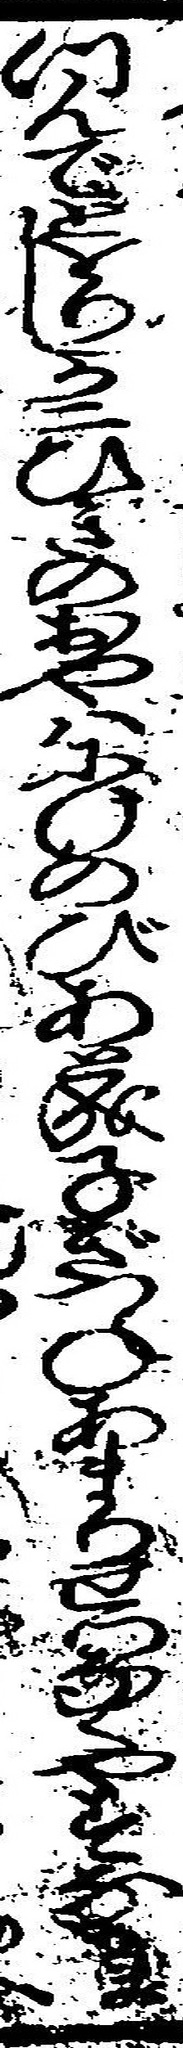つんでとをりしか二ひきのおやはにけのびあと成子ぎつねあまりせつなくやすなかま
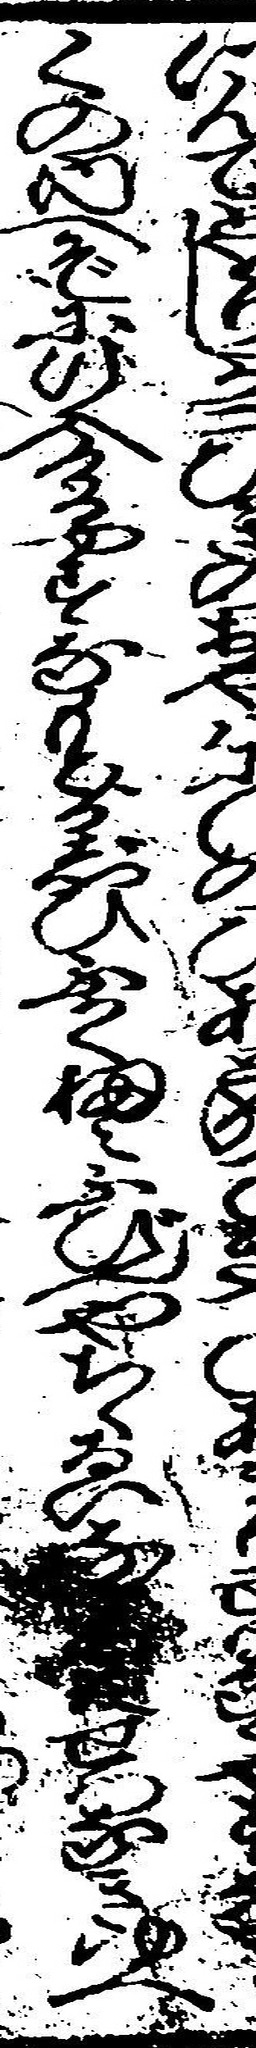くの内へぞにけ入けるやすなもとゟじひふかく扨々ふびんやちくるいなせつなきゆへ
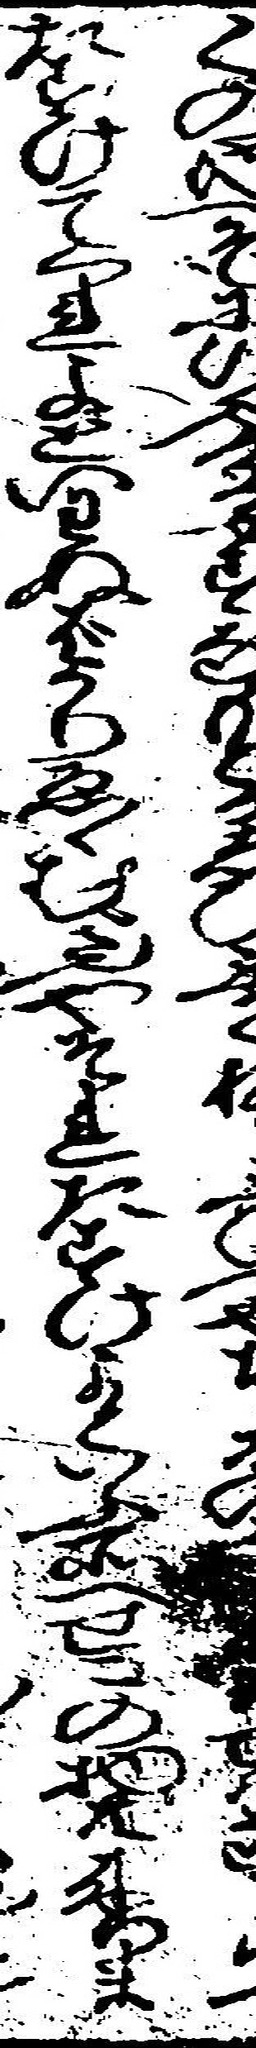たすけてくれよといわぬばかりゑゝむざんやそれたすけよといふ所へせこの物共来りま
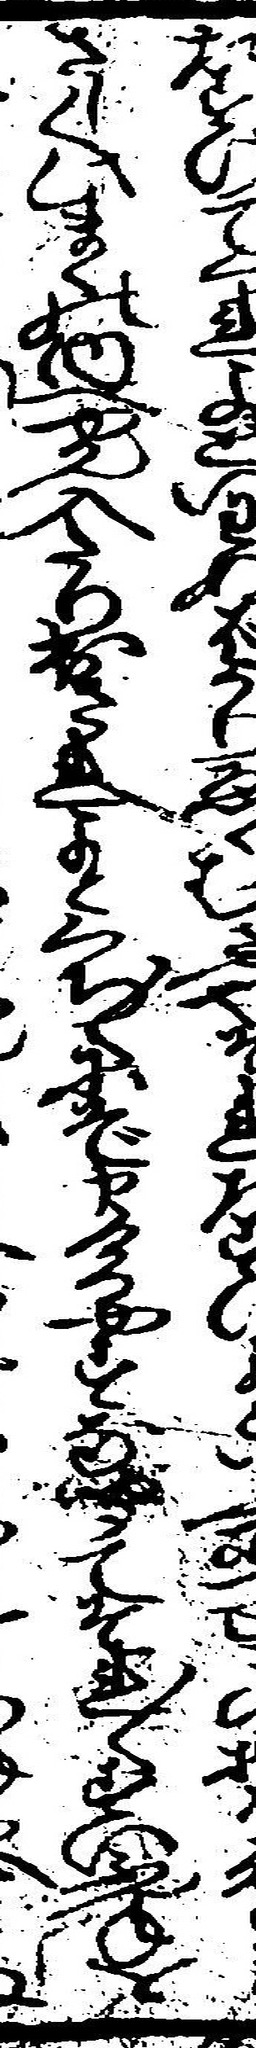さしく此まくの内へやかん入たり出されよとくち〳〵にぞ申けるやすな聞てそれ〳〵すいふん手を
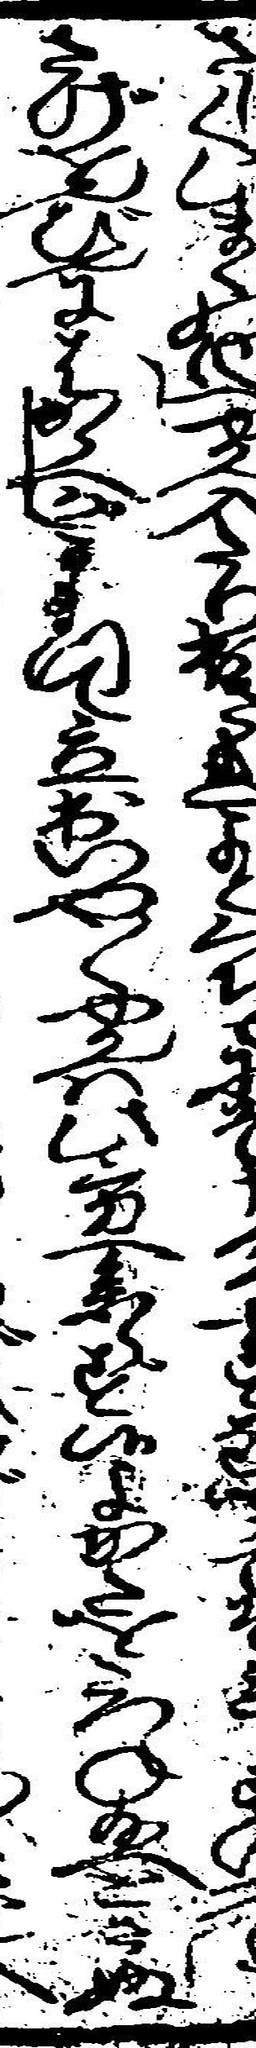さげをんびんにはからへかしこまつて立出いや〳〵やかんは此方へ参らず候よかたをたつね給へとさらぬ
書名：[しのだづまつりぎつね付あべの清明出生]
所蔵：東京大学総合図書館 General Library in the University of Tokyo, JAPAN
